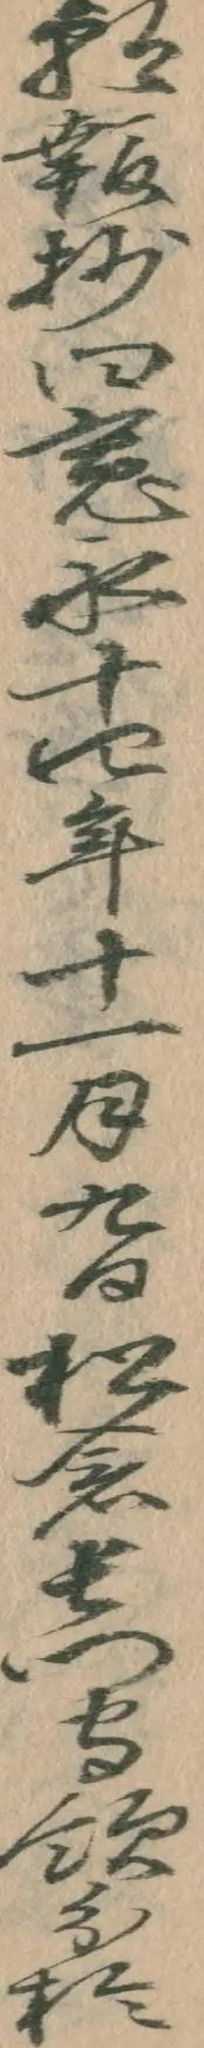朝報抄曰寛永十四年十一月九日松倉長門守領分於
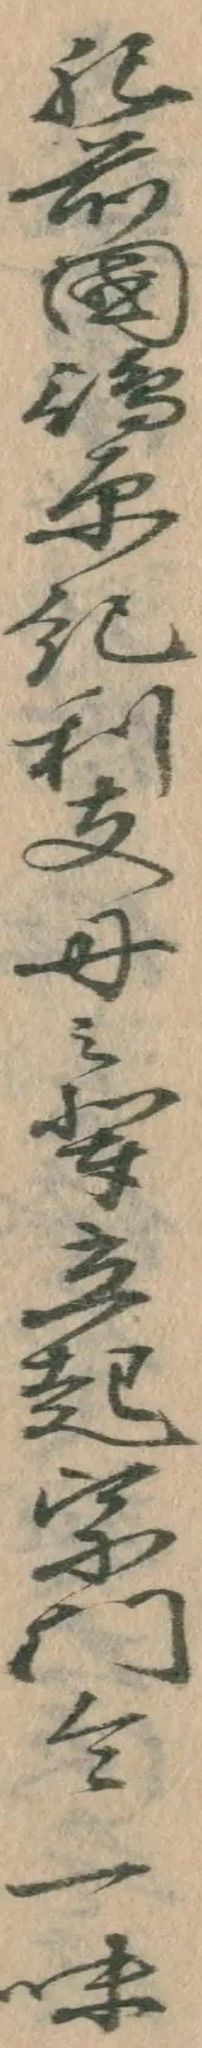肥前国島原紀利支丹之輩立起宗門令一味
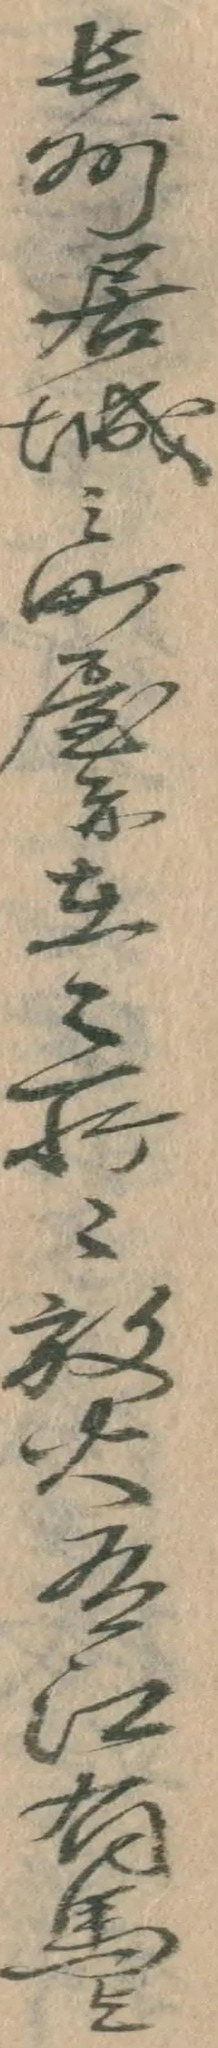長州居城之町屋幷在々所々放火有江有馬与
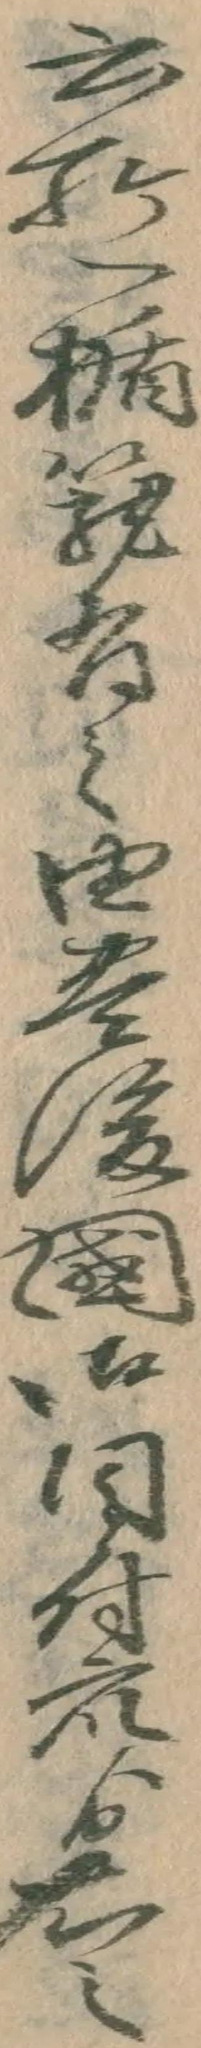云所へ楯籠有之由豊後国御目付衆ゟ右之
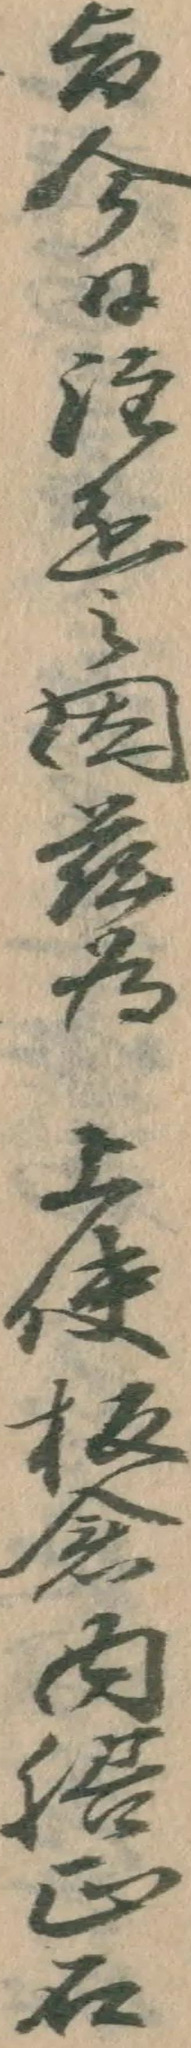旨今日注進之子固茲為上使板倉内膳正石
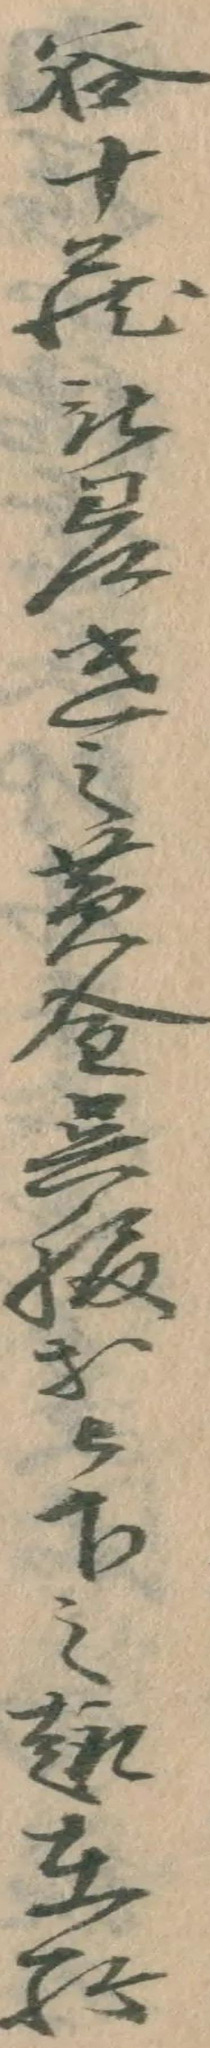谷十蔵被差遣之黄金呉服等被下之趣在所
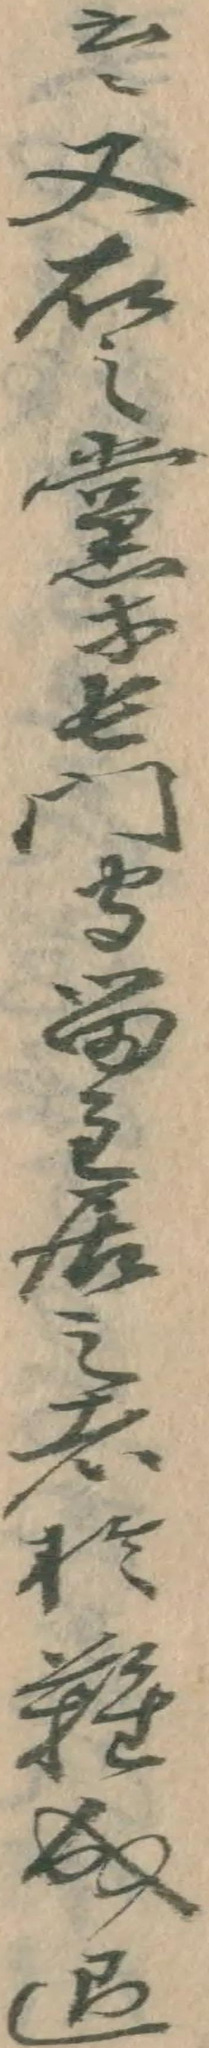云に又右之党等長門守留守居之者於難成退
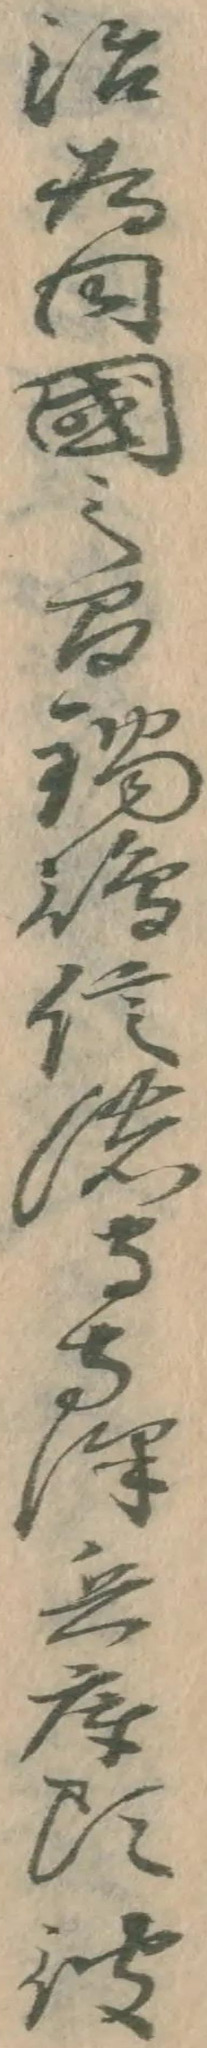治為同国之間鍋島信濃守寺沢兵庫頭彼

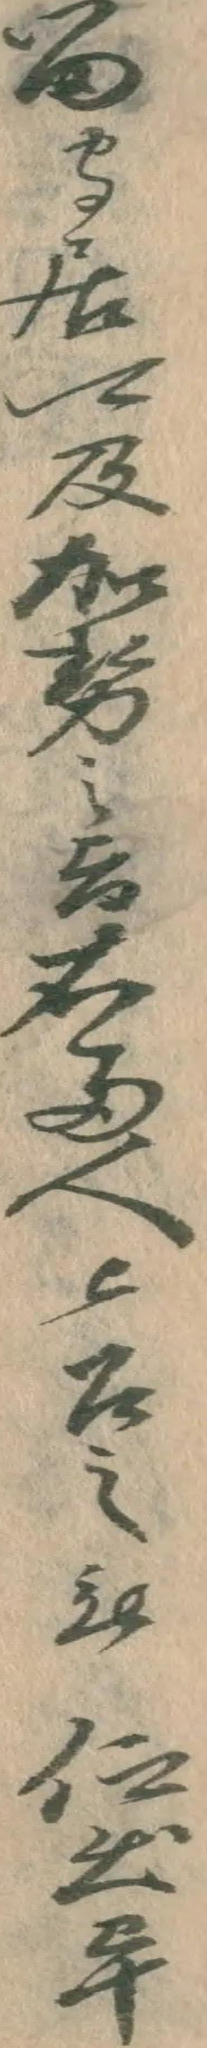留守居可及加勢之旨右両人被召之被仰出畢
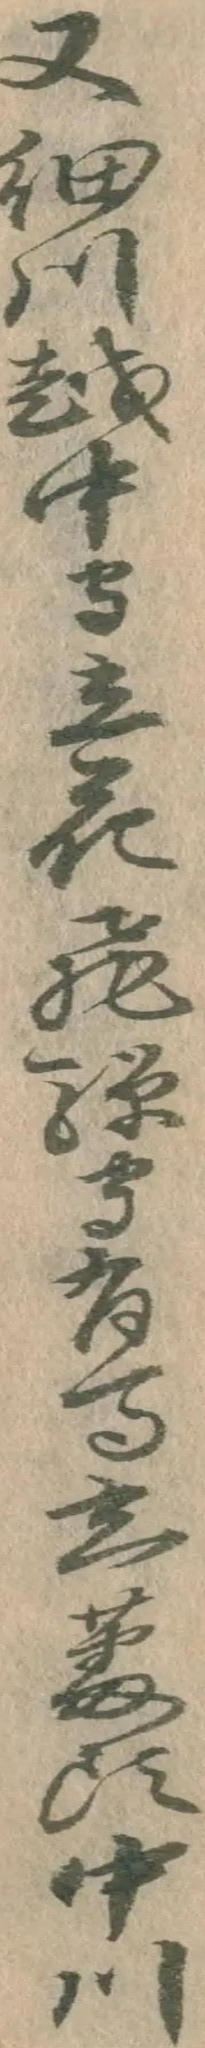又細川越中守立花飛騨守有馬玄蕃頭中川
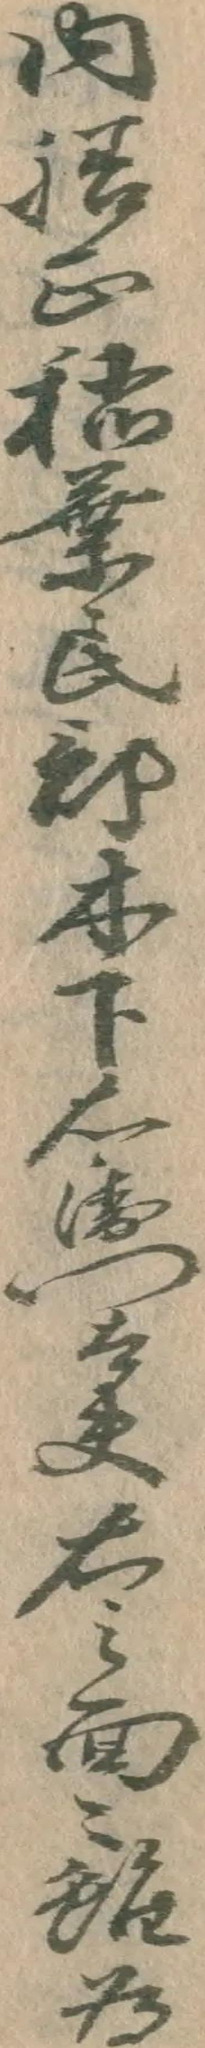内膳正稲葉民部木下右衛門太夫右之面々雖為
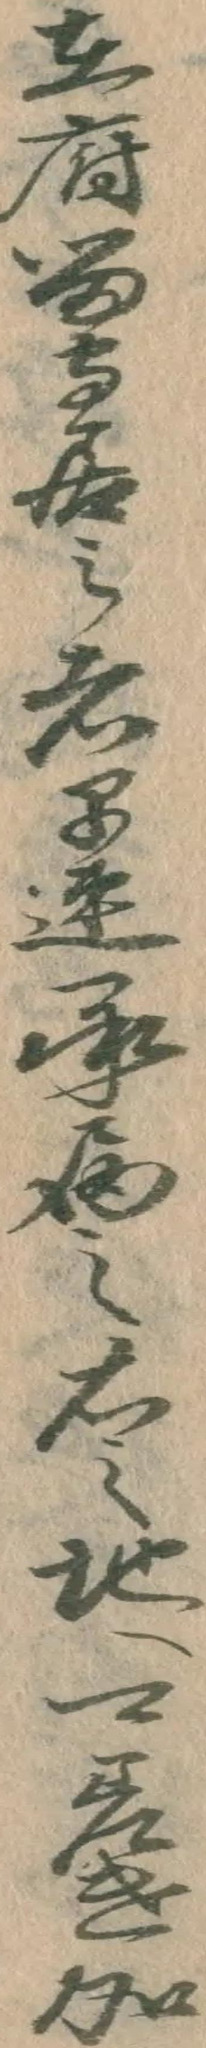在府留守居之者早速承届之右之地へ可着遣加
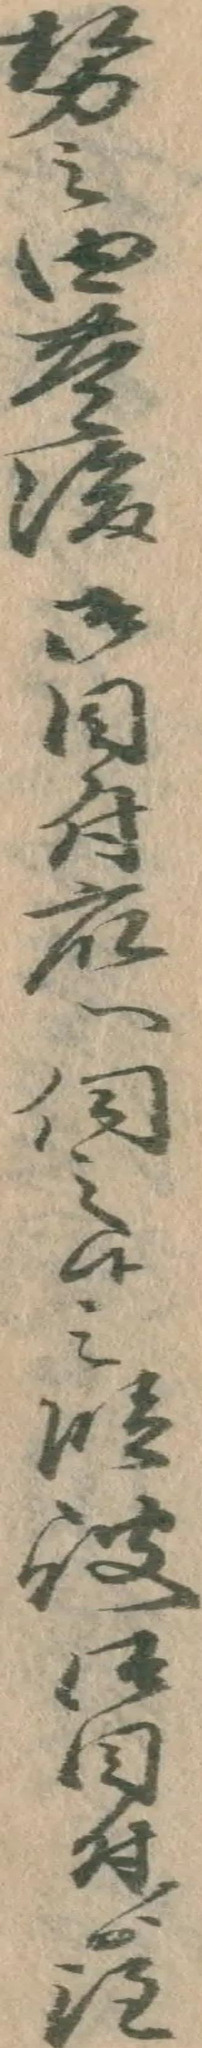勢之由豊後御目付衆へ伺之候之段彼御目付ゟ注
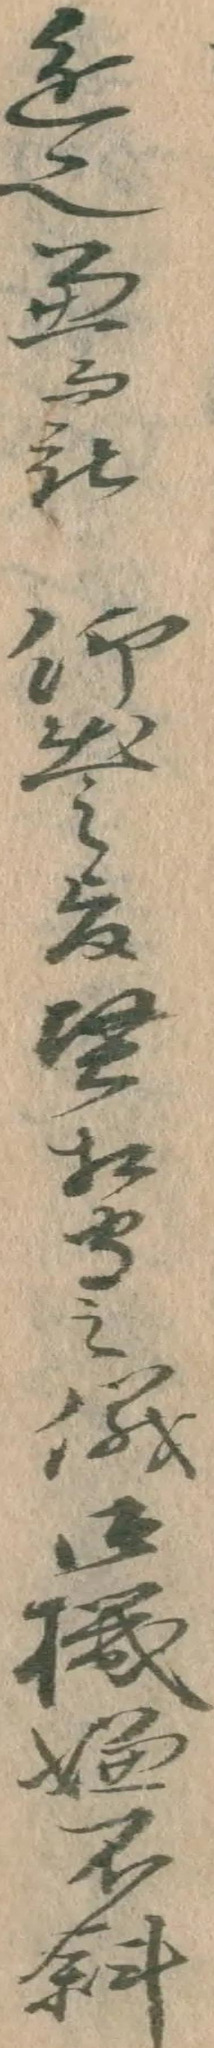進也兼而被仰出之旨皆相守之儀御機嫌不斜
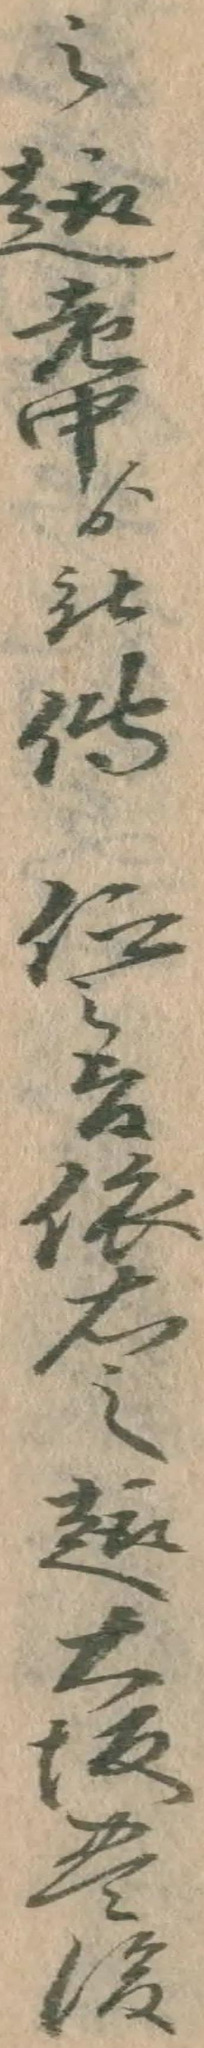之趣老中ゟ被伝仰之旨依右之趣大坂豊後
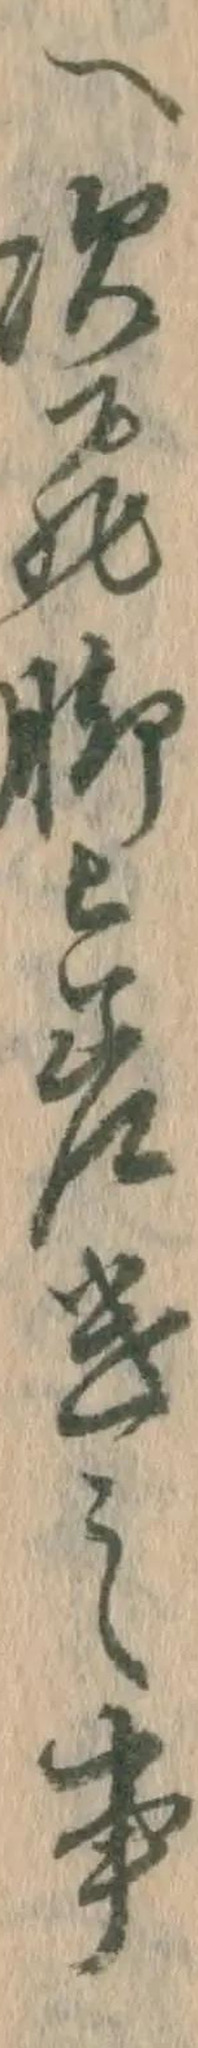へ次飛脚被差遣之事
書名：切支丹御退治記 49巻. [2]
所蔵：国立国会図書館 National Diet Library, JAPAN
